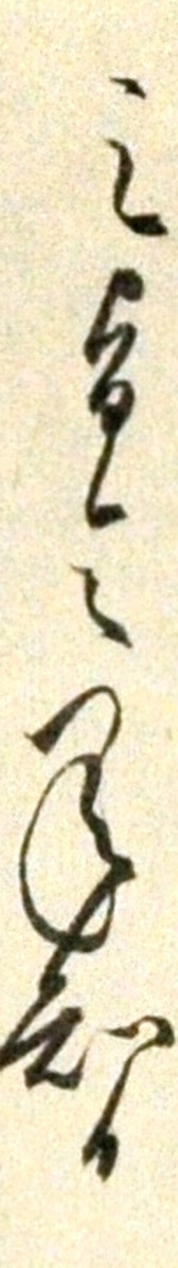之旨令承知候
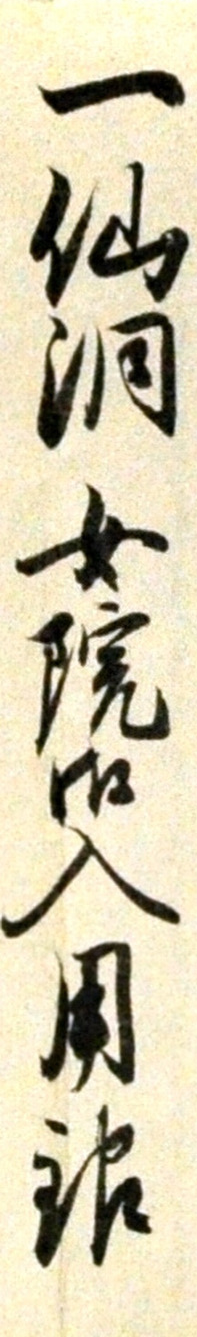一仙洞女院御入用銀
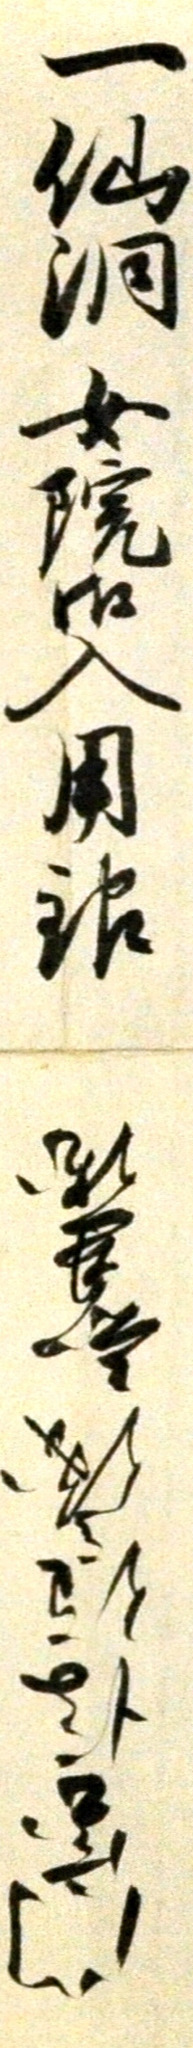一仙洞女院御入用銀
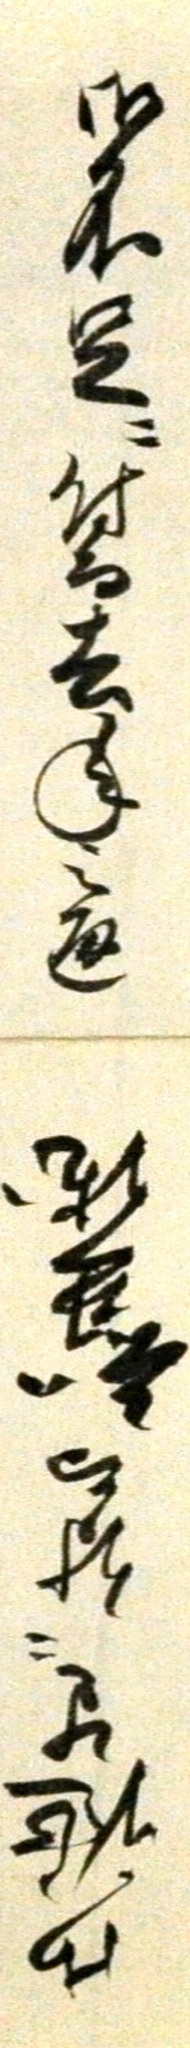御不足ニ付而去年之通
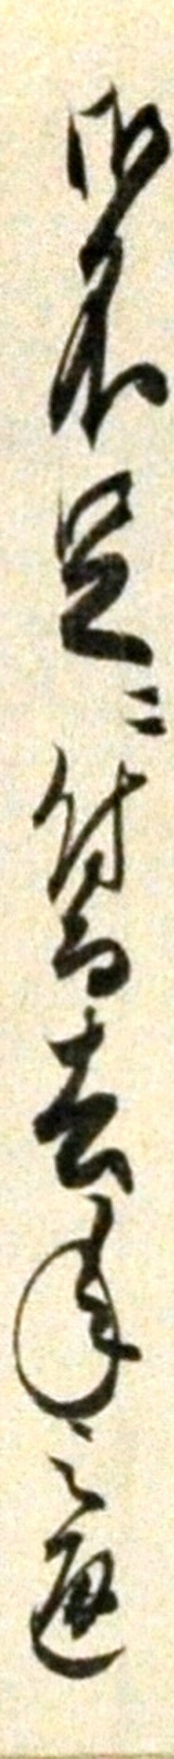御不足ニ付而去年之通
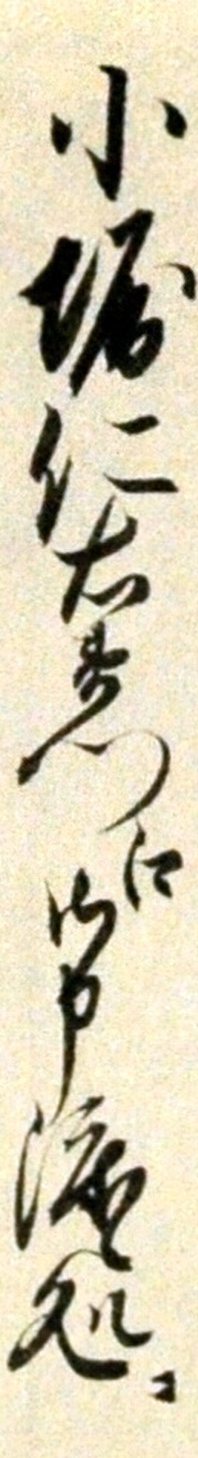小堀仁右衛門江御申渡候処ニ
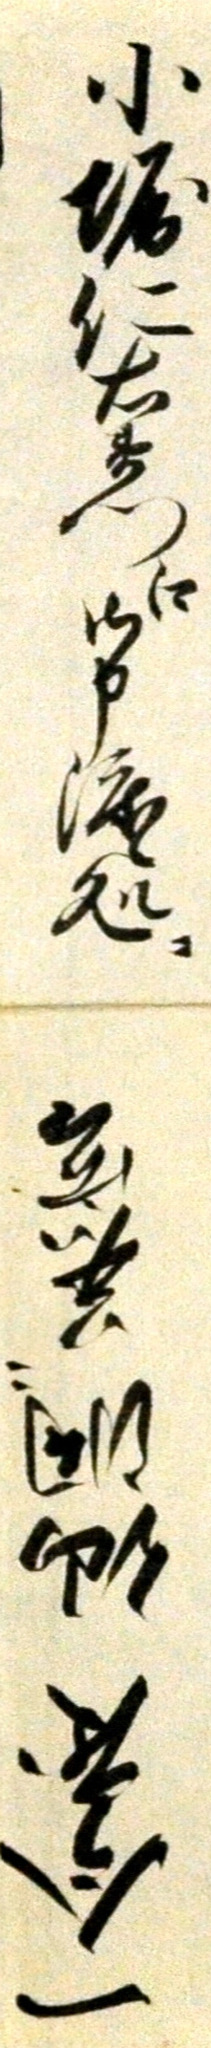小堀仁右衛門江御申渡候処ニ
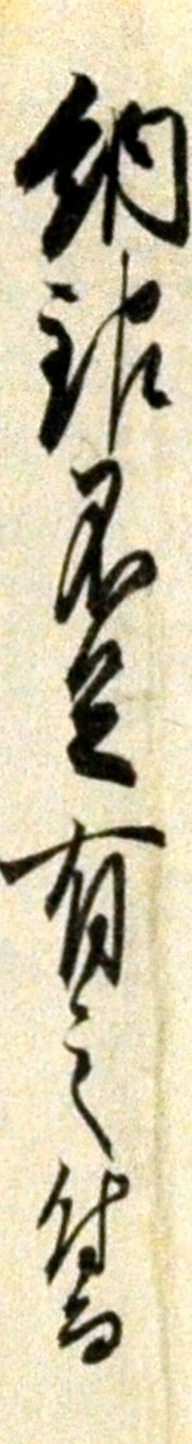納銀不足有之付而
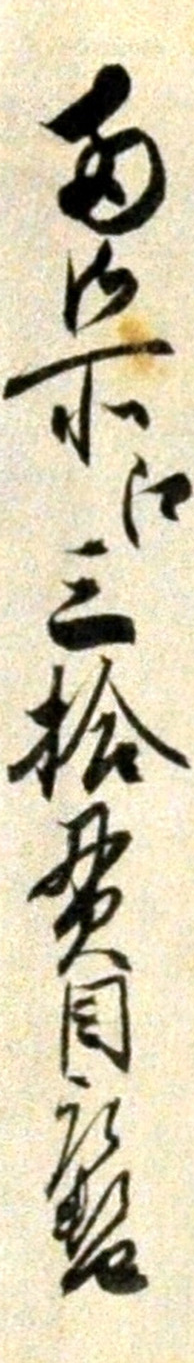両御所江三拾貫目被整
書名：書状
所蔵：伊那市立高遠町図書館・合同会社AMANE
